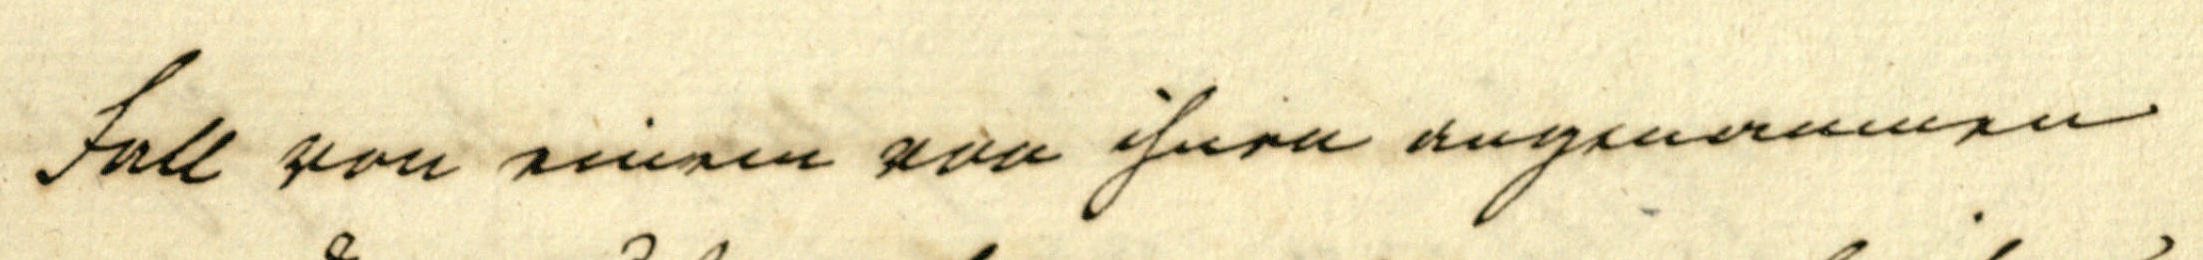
Fall von einem von ihnen angenommen
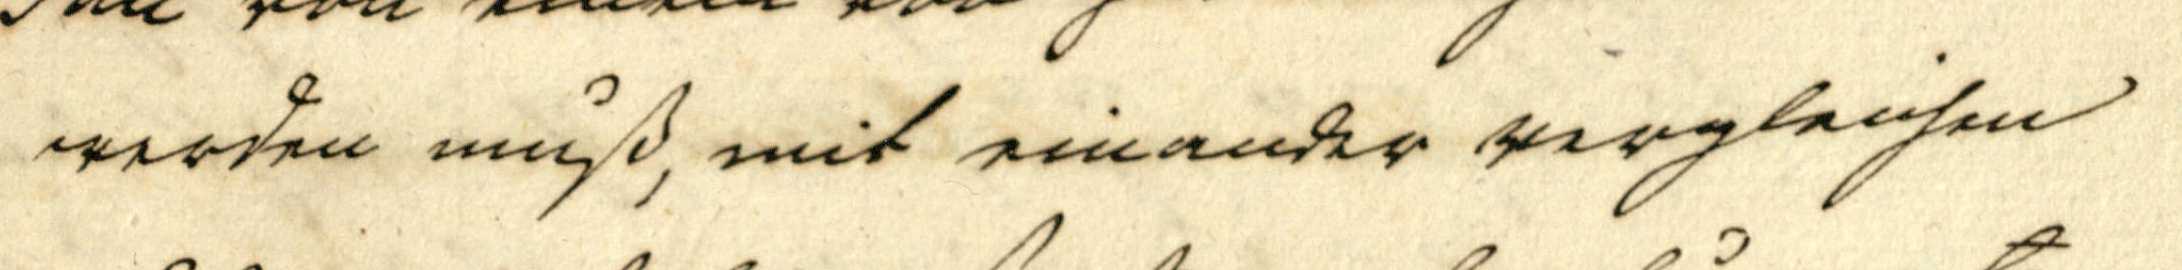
werden muß, mit einander vergleichen
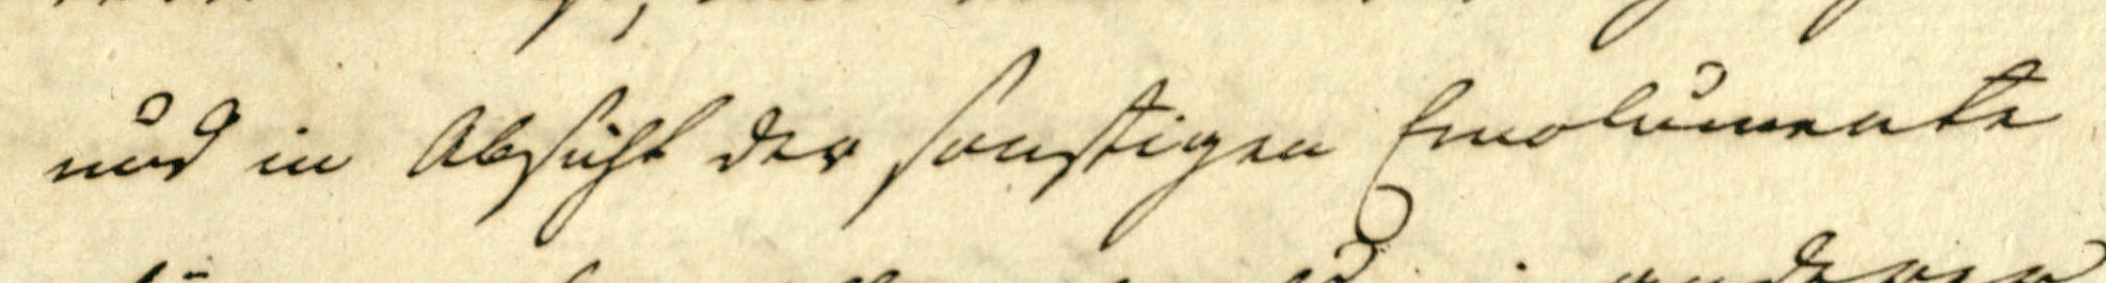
und in Absicht der sonstigen Emolumente
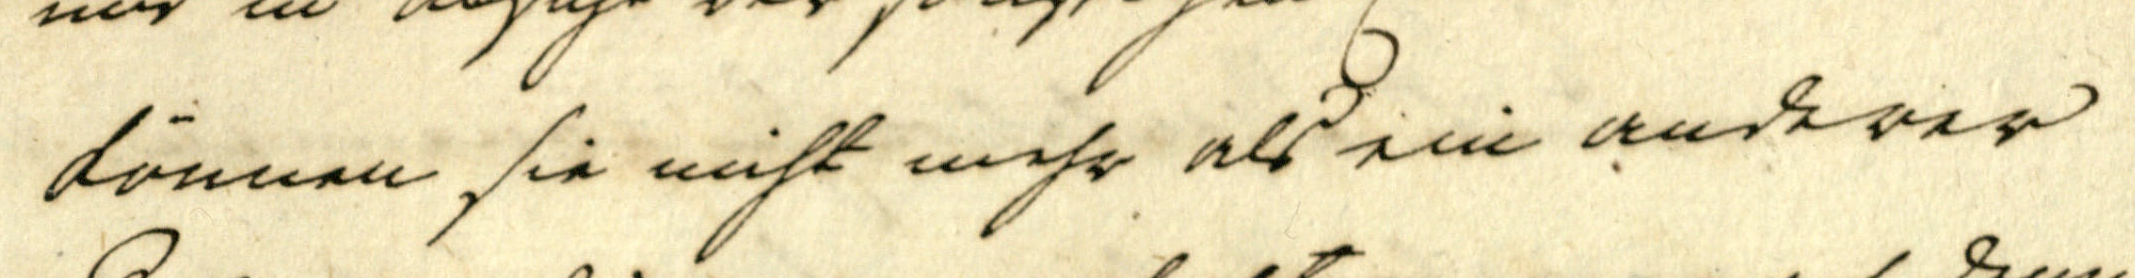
können sie nicht mehr als ein anderer
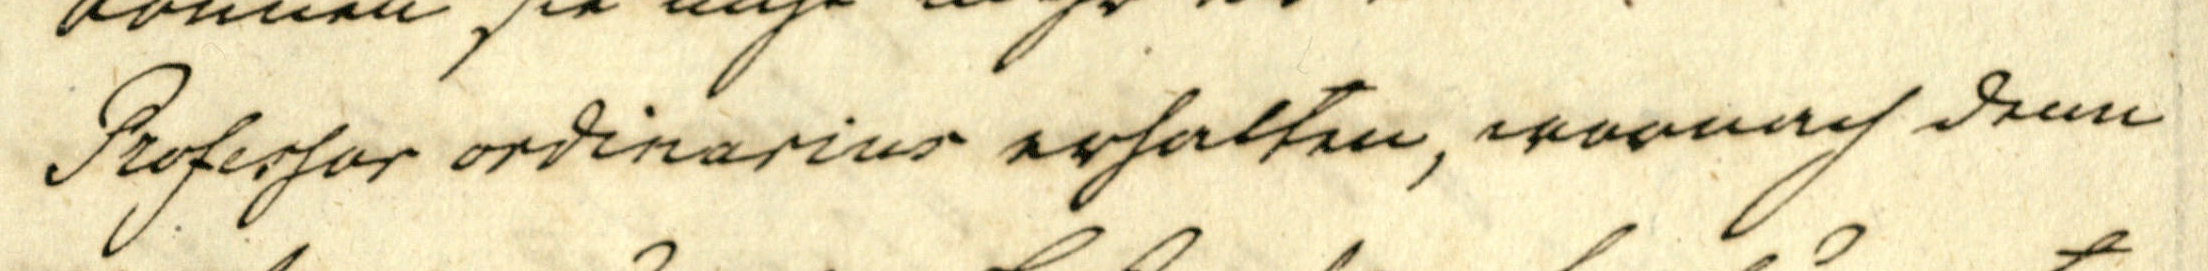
Professor ondinarius erhalten, wornach denn
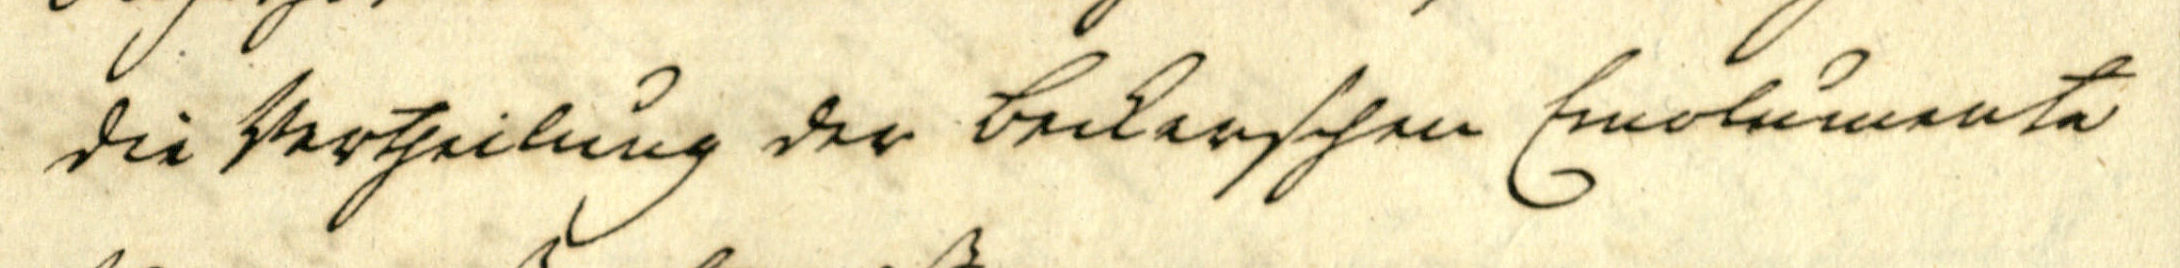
die Vertheilung der Beckerschen Emolumente
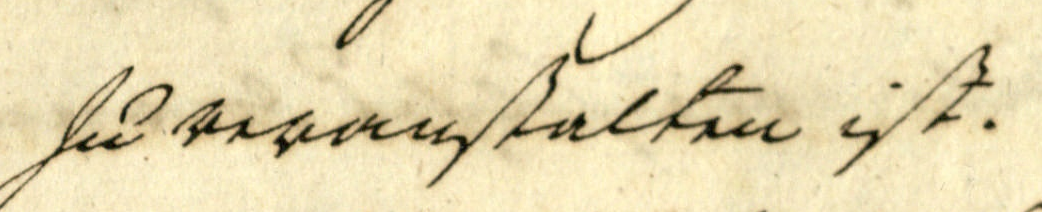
zu veranstalten ist.
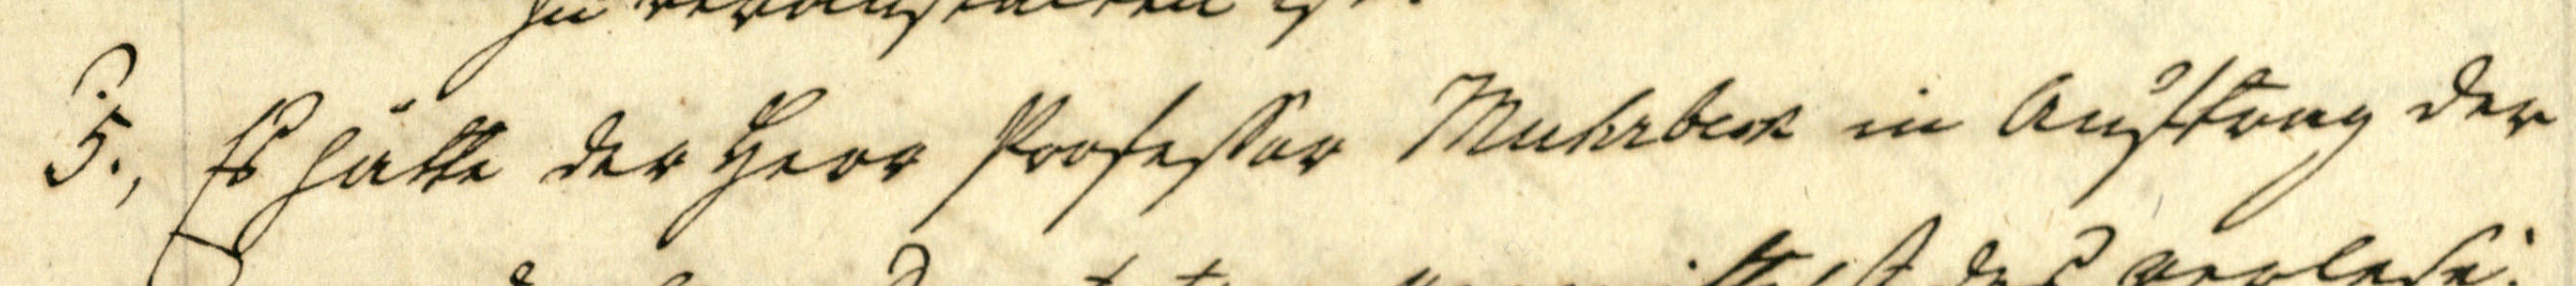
5., Es hätte der Herr Professor Muhrbeck in Auftrag der
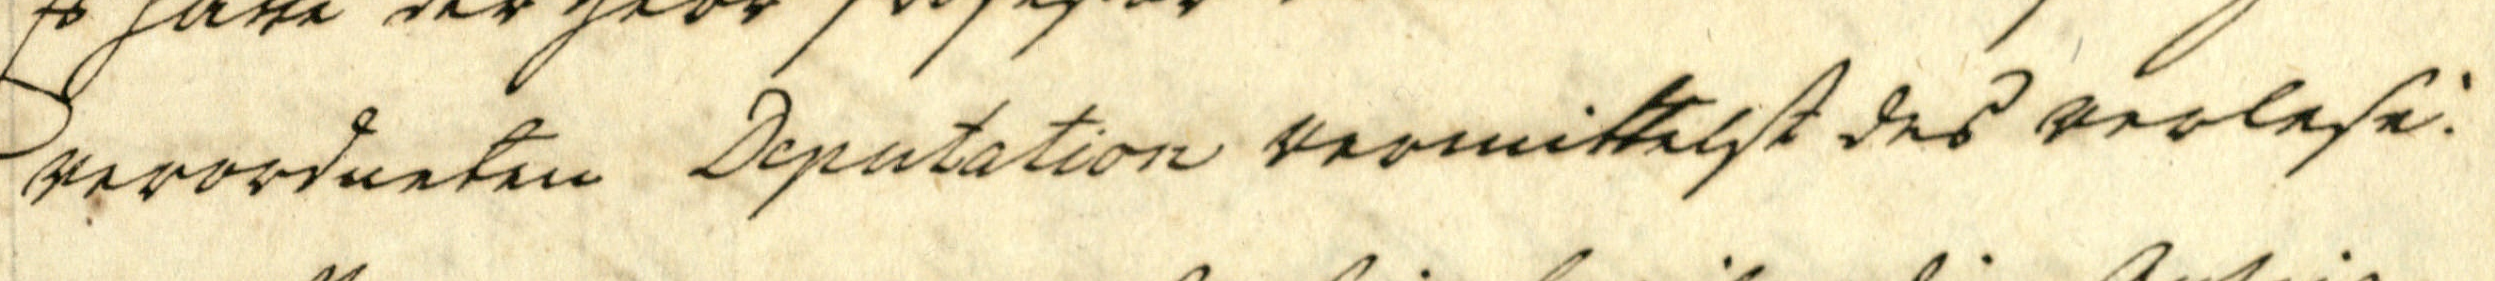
verordneten Deputation vermittelst des verlese¬
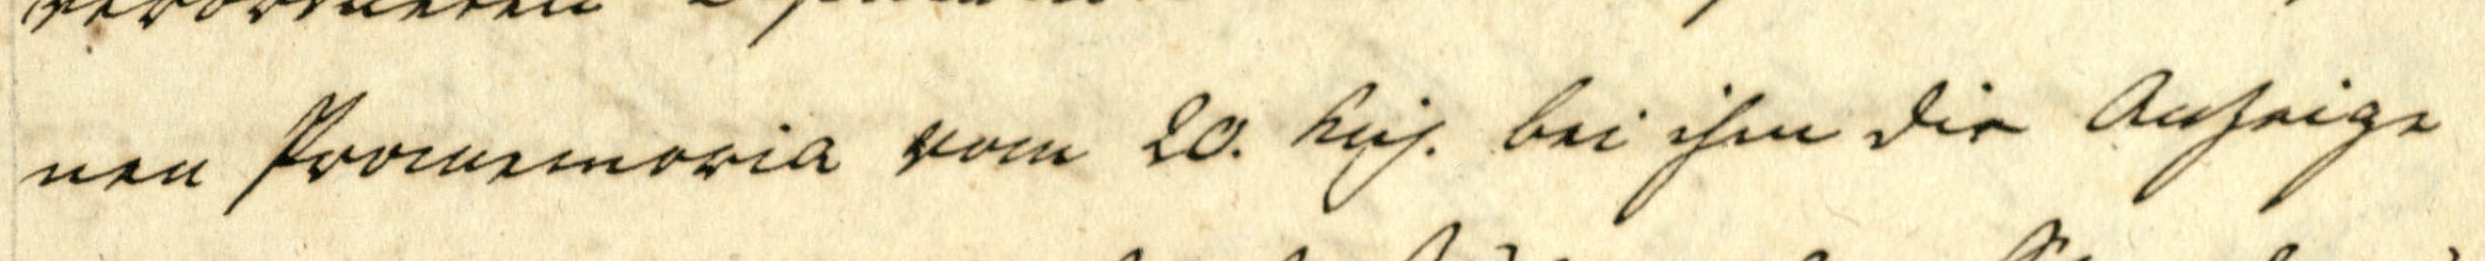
nen Promemoria vom 20. huj. bei ihm die Anzeige
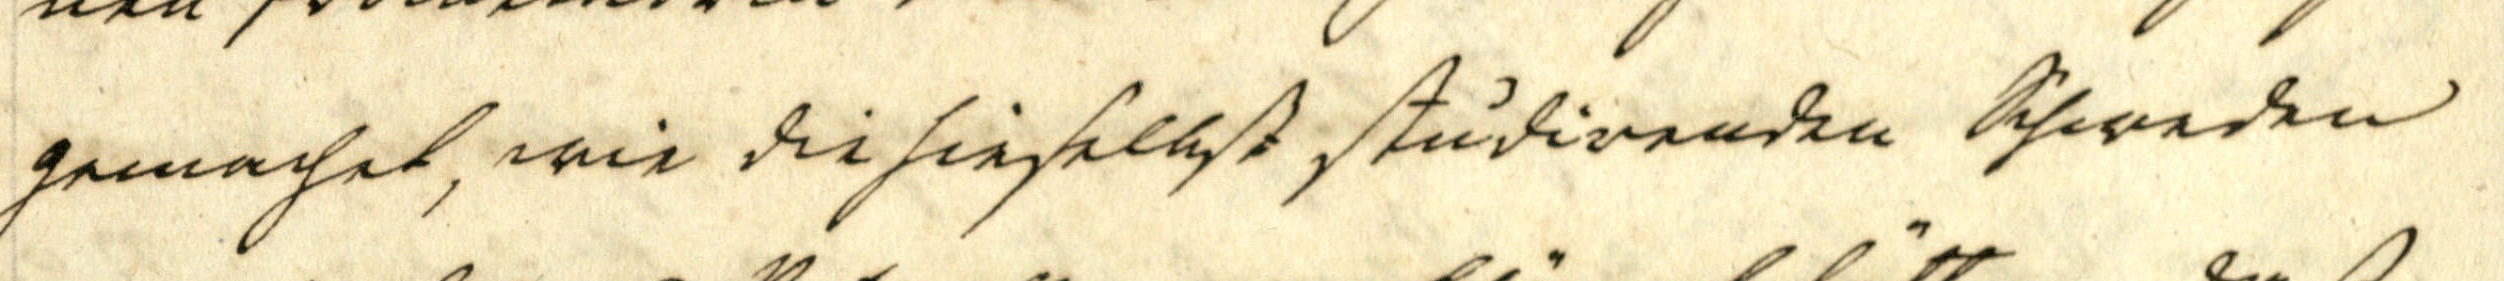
gemachet, wie die hieselbst studirenden Schweden
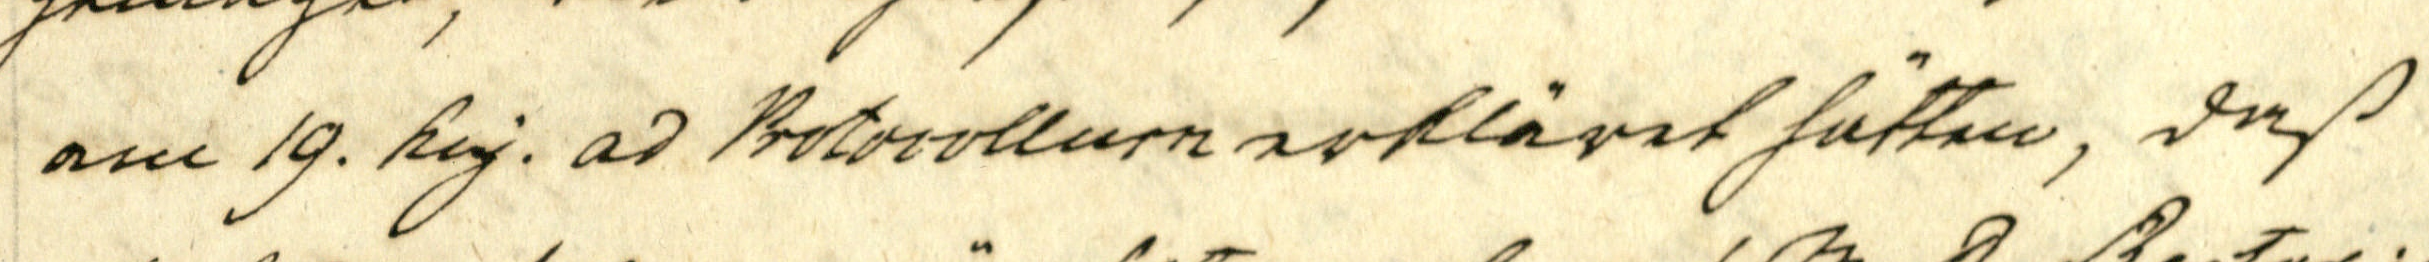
am 19. huj. ad Protocollum erkläret hätten, daß
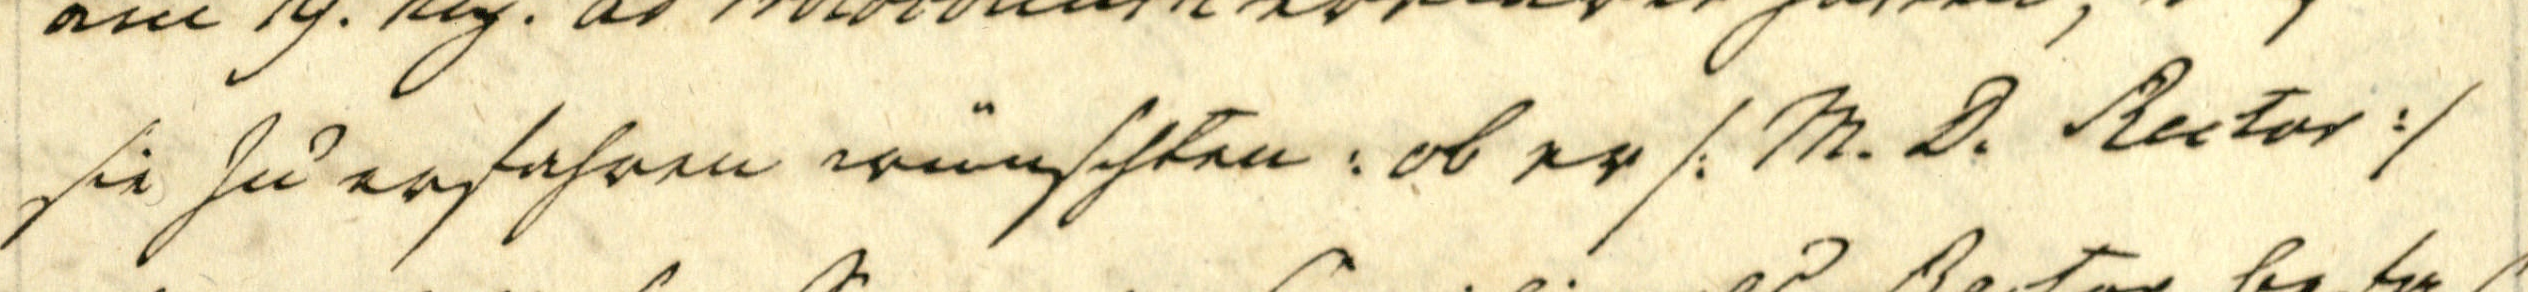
sie zu erfahren wünschten: ob er /.M. D. Rector:/
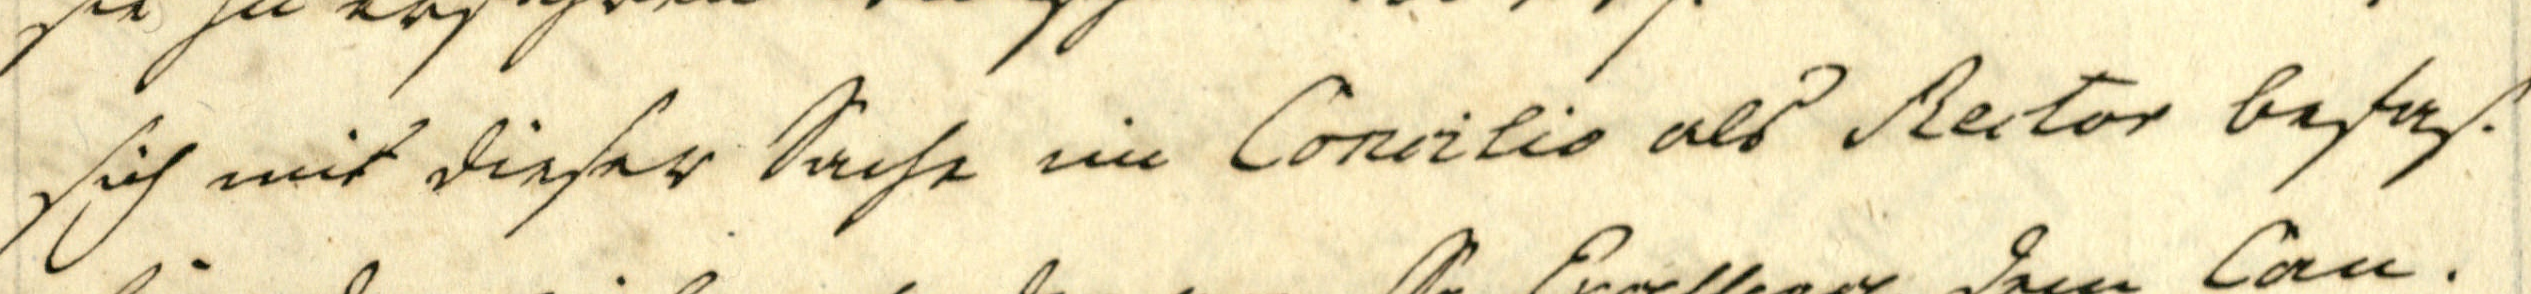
sich mit dieser Sache im Concilio als Rector befas¬
